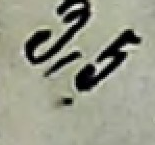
3,5
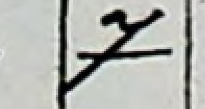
7
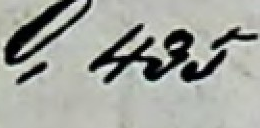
0,435
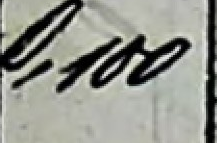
0,100
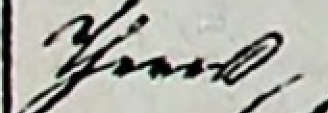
Theres
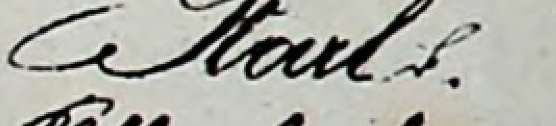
Starl v.
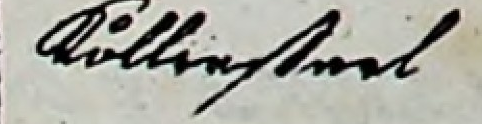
Köllenstarl
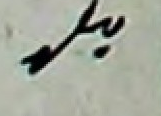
do
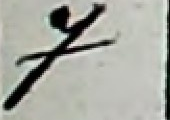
7
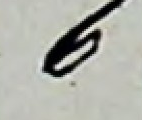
6
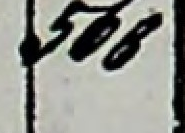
568
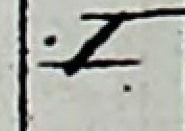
I
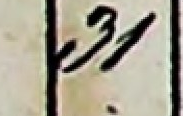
31
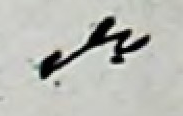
do
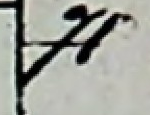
71
